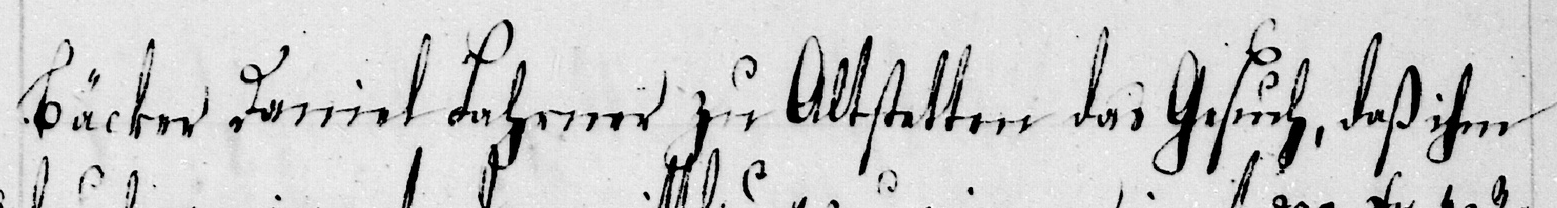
Bäcker Daniel Fahrner zu Altstetten das Gesuch, daß ihm
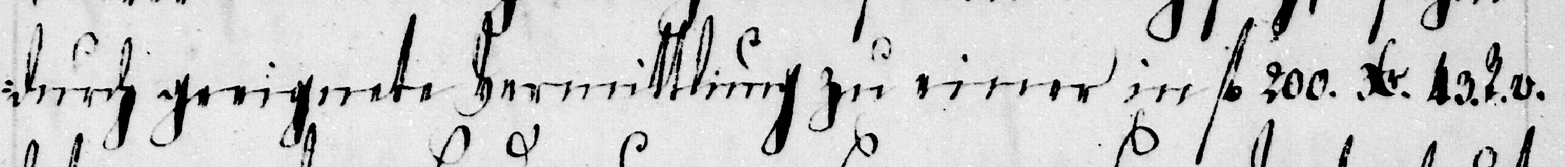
durch geeignete Vermittlung zu einer in fl. 200. Xr. 43. R.
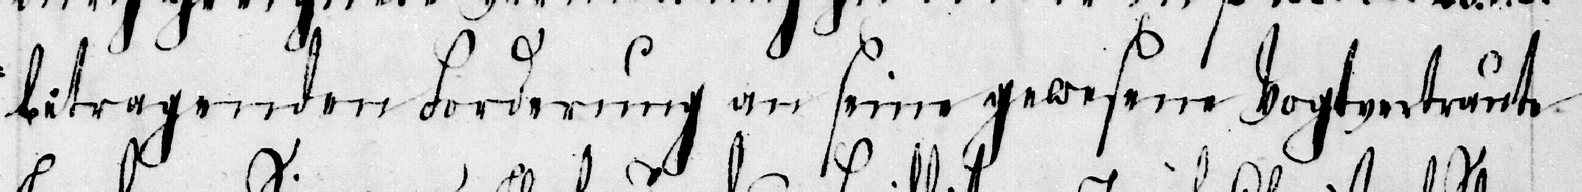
betragenden Forderung an seine gewesene Vogtvertraute
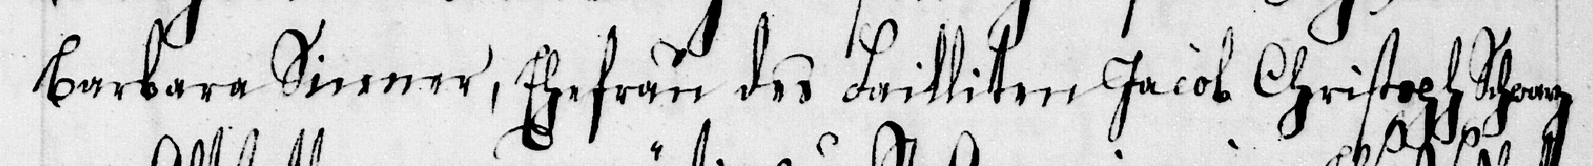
Barbara Sinner, Ehefrau des Failliten Jacob Christoph Schwa¬
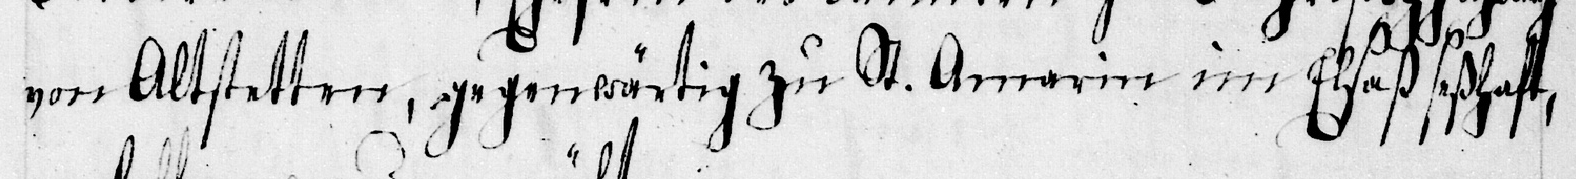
von Altstetten, gegenwärtig zu St. Amarin im Elsaß seßhaft,
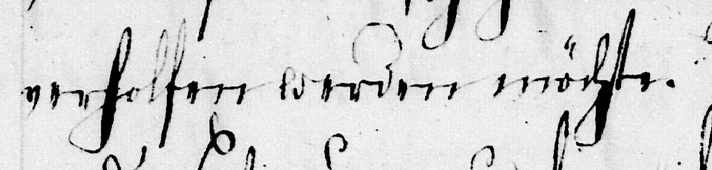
verholfen werden möchte.
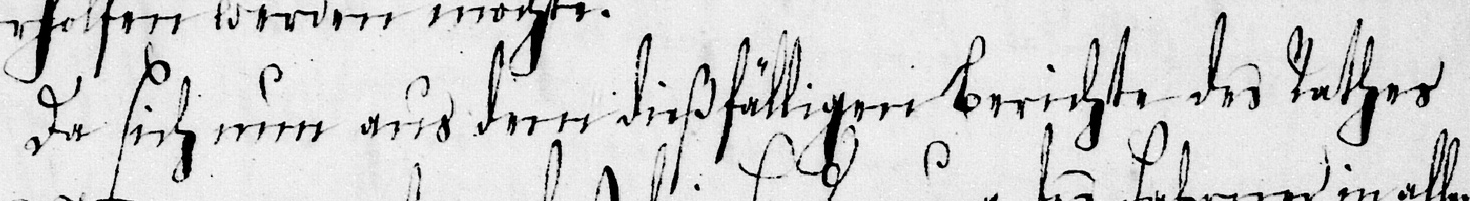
Da sich nun aus den dießfälligen Berichte des Rathes
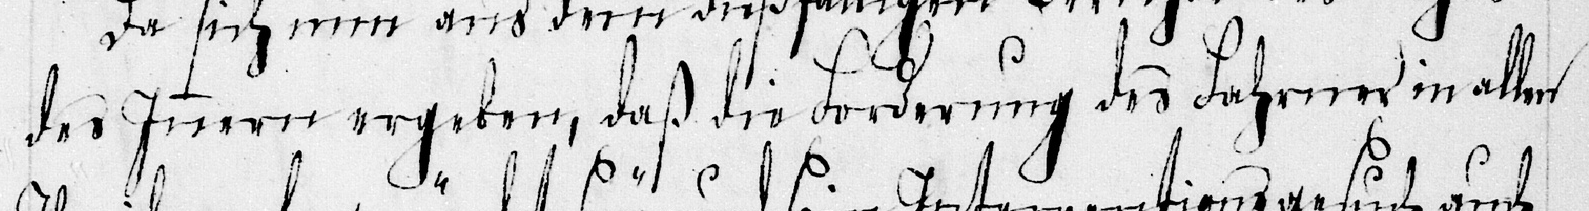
des Innern ergeben, daß die Forderung des Fahrner in allen
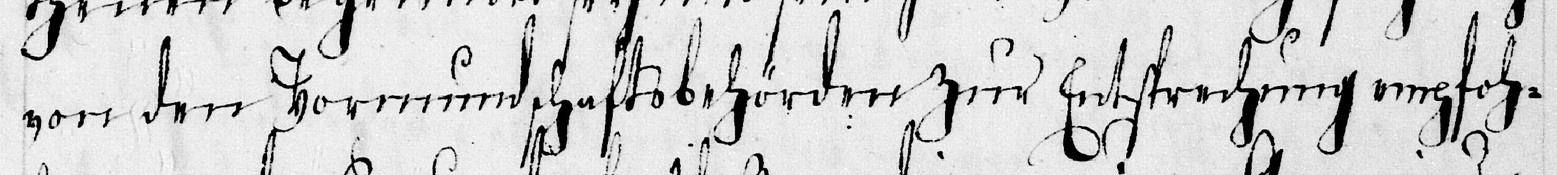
von den Vormundschaftsbehörden zur Entsprechung empfoh¬
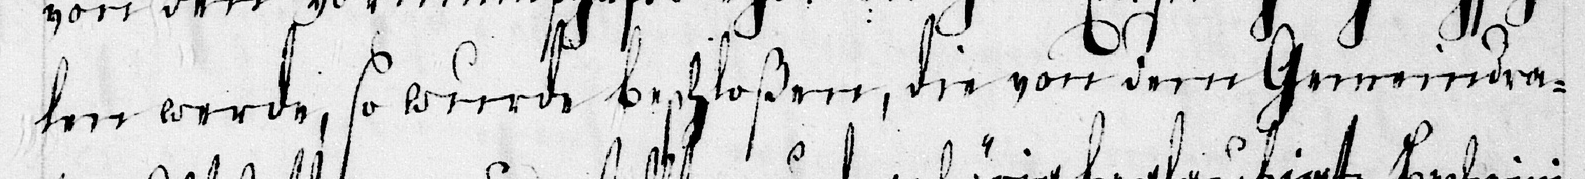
len werde, so wurde beschloßen, die von dem Gemeindra¬
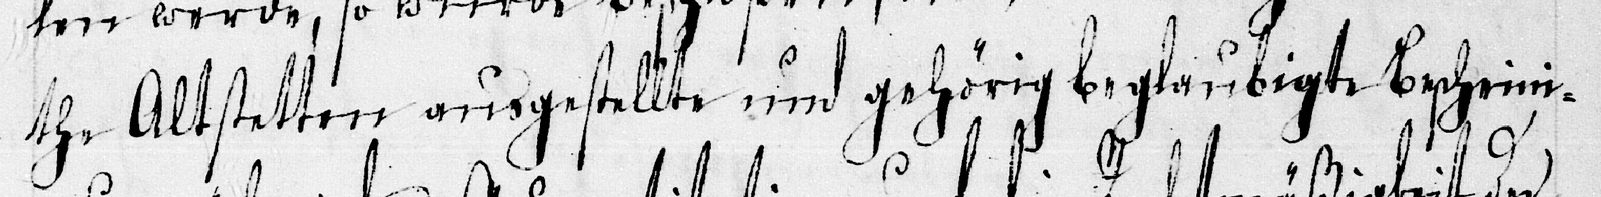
the Altstetten ausgestellte und gehörig beglaubigte Bescheini¬
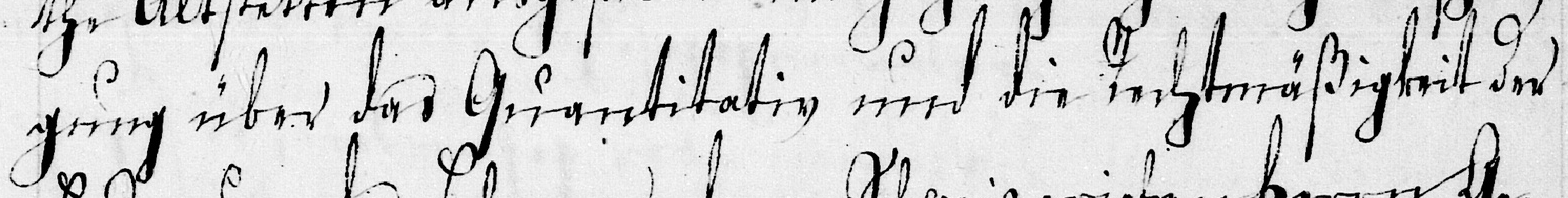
gung über das Quantitativ und die Rechtmäßigkeit der
